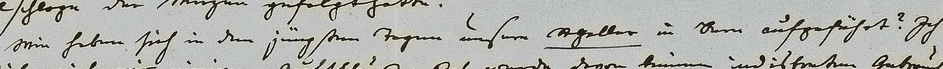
Wie haben sich in den jüngsten Tagen unsere St Galler in Bern aufgeführt? Ich
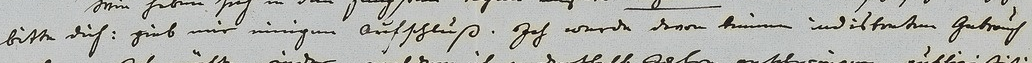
bitte dich: gieb mir einigen Aufschluß. Ich werde dessen keinen indiskreten Gebrauch
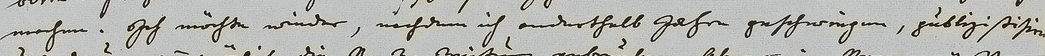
machen. Ich möchte wieder, nachdem ich anderthalb Jahre geschwiegen, publizistisiren
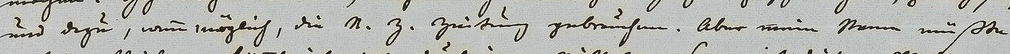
und dazu, wenn möglich, die N. Z. Zeitung gebrauchen. Aber mein Name müßte
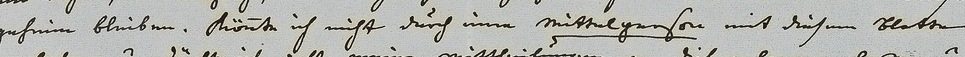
geheim bleiben. Könnte ich nicht durch eine Mittelperson mit diesem Blatte
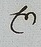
Es
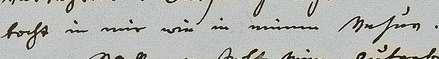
kocht in mir wie in einem Vesuv.
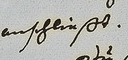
anschließt.
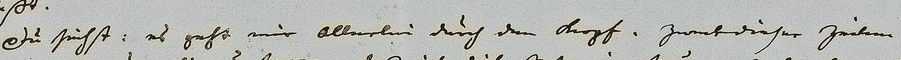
Du siehst: es geht mir Allerlei durch den Kopf. Zweck dieser Zeilen
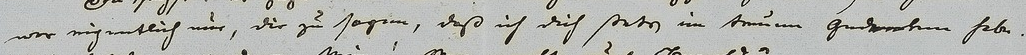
war eigentlich nur, dir zu sagen, daß ich dich stets im treuen Gedenken habe.
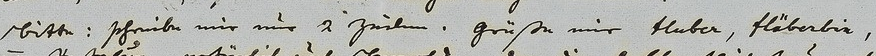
Bitte: Schreibe mir nur 2 Zeilen. Grüße mir Huber, Häberlin,
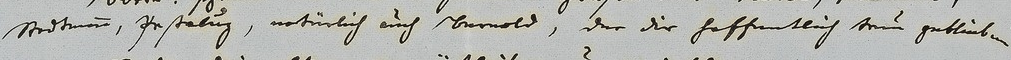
Stadtmann, Pestaluz, natürlich auch Bernold, der dir hoffentlich treu geblieben.
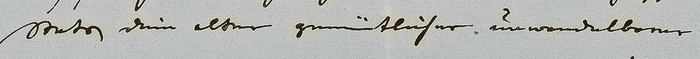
Stets dein alter gemütlicher unwandelbarer
